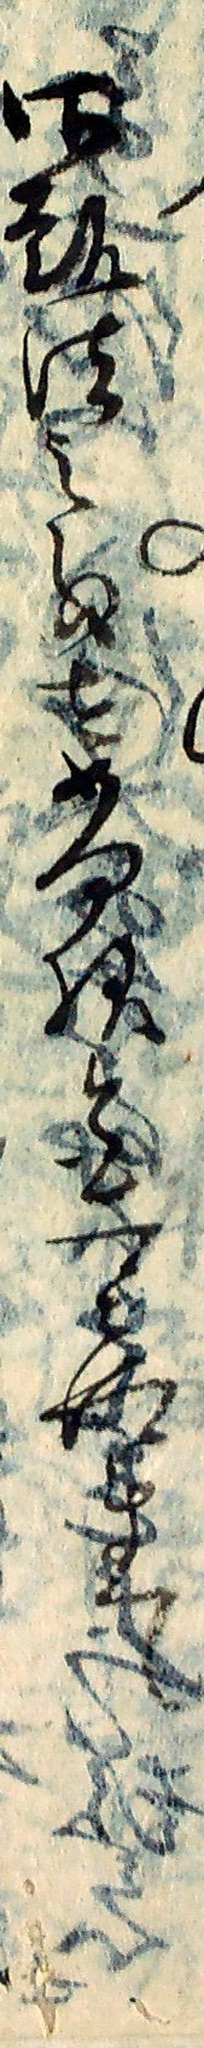御趣法之義は如何様とも可被仰付候
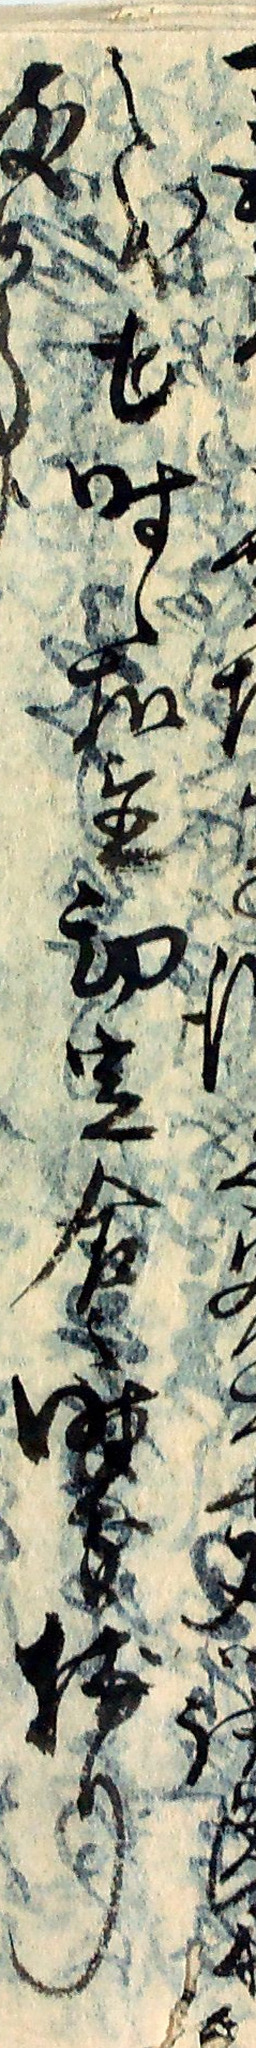之義も時々扣置勘定合之時分捕引
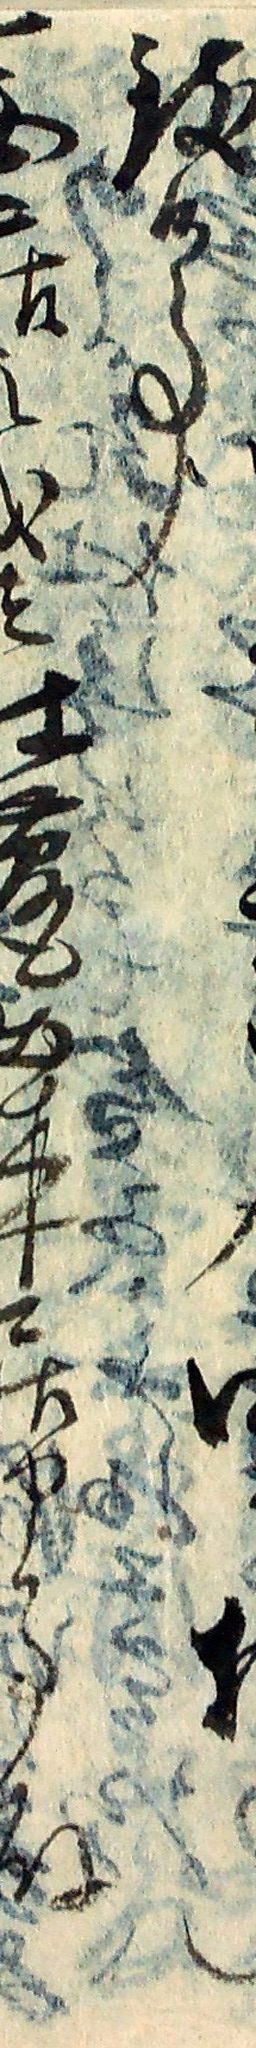一宮居之義は仕菅も出来居申候事故
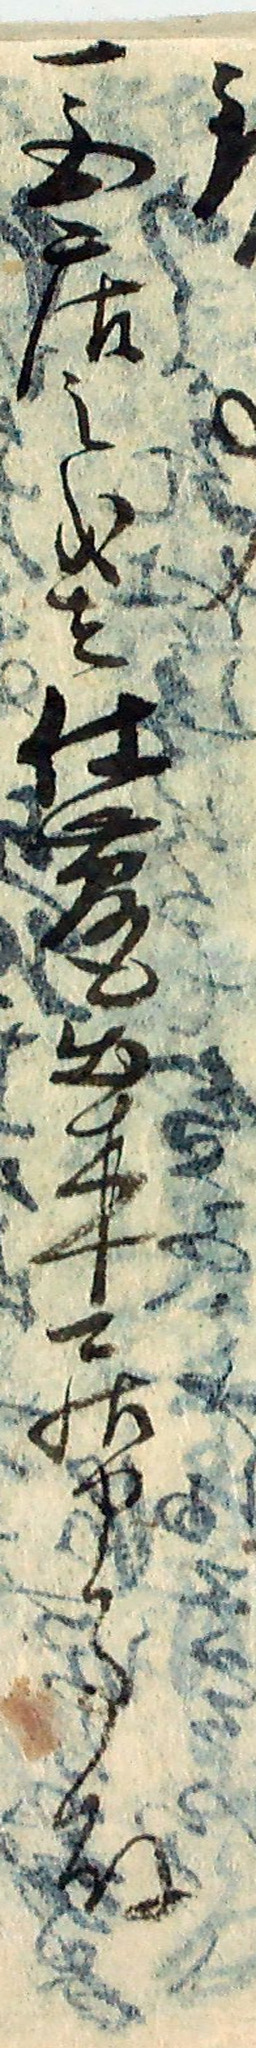一宮居之義は仕菅も出来居申候事故
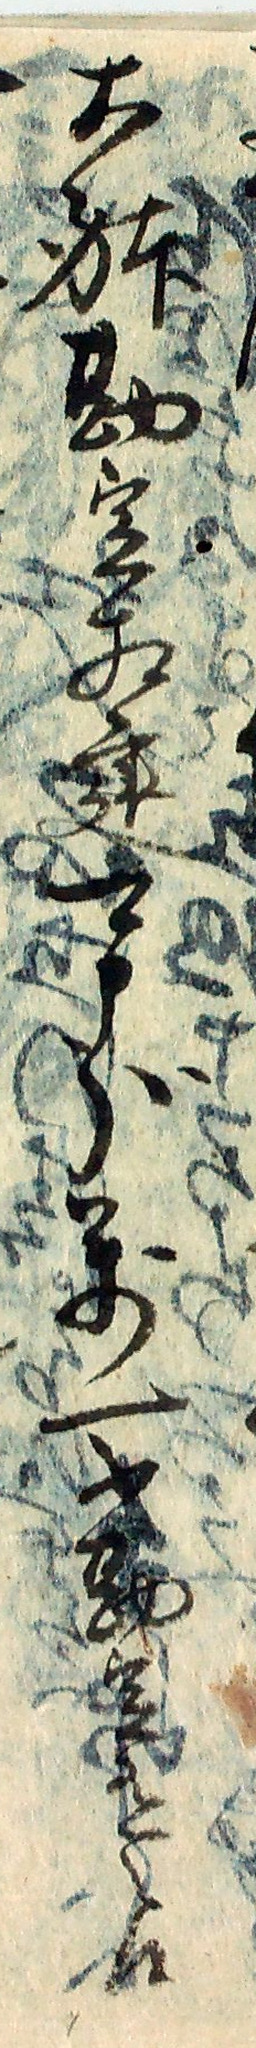大体勘定相建可申哉万一不勘定有之候
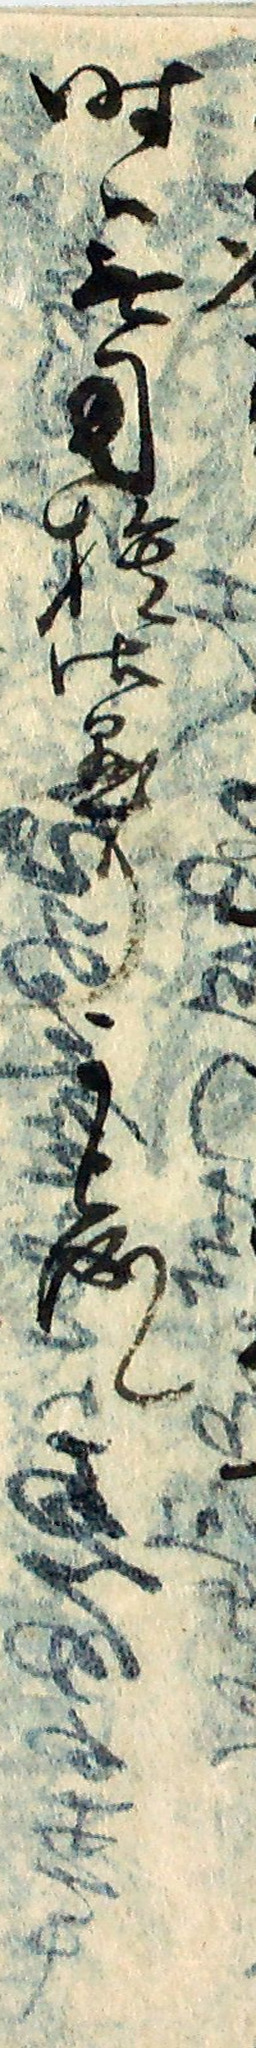時は無用捨御懸り可被成候
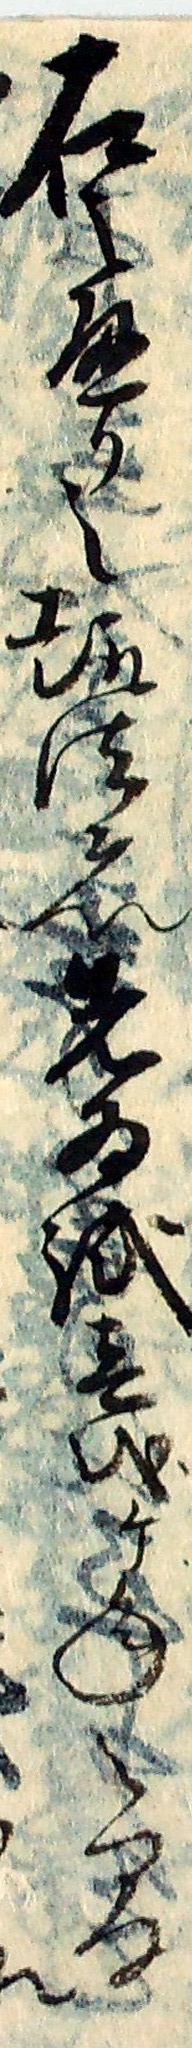右之通り之趣法を以先為試壱弐ヶ年之間
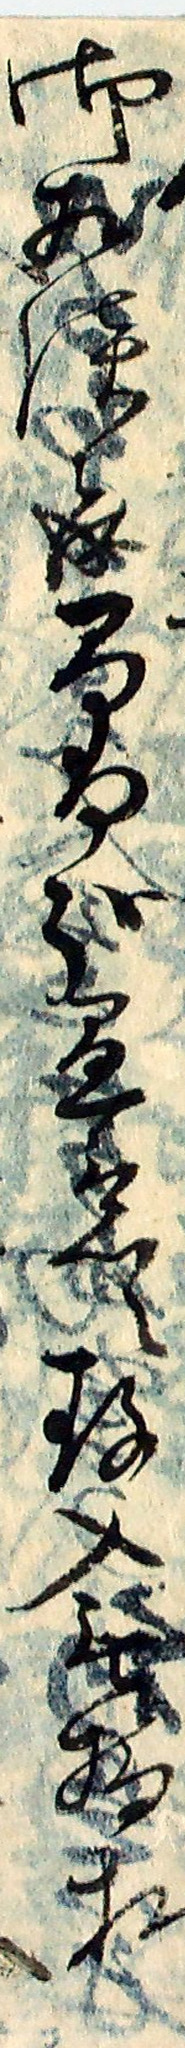御相談被成間布哉懸念之存入無指扣
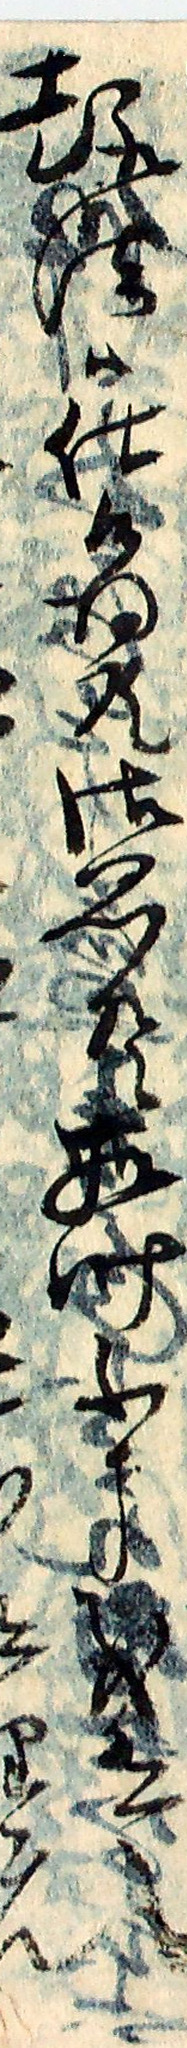趣法は仕候得共御思召に相叶不申義有之
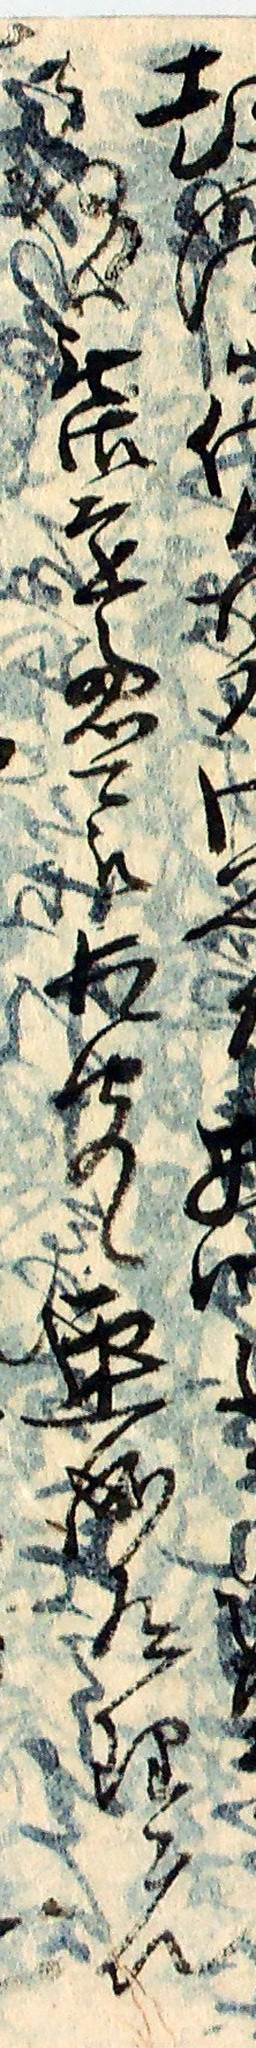候得は無御遠慮被仰聞候速成道理を以
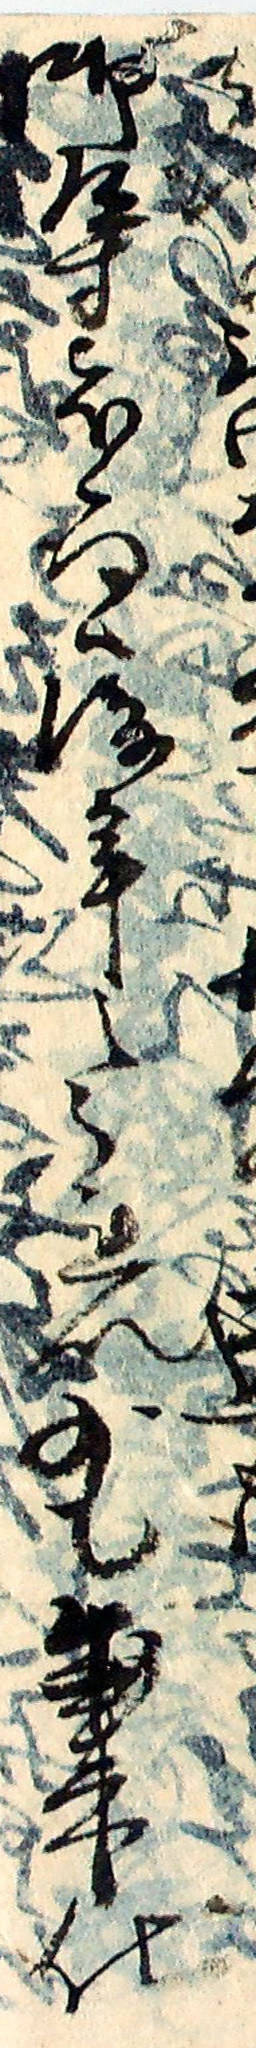御導被下候得は後年之うれい少も出来仕

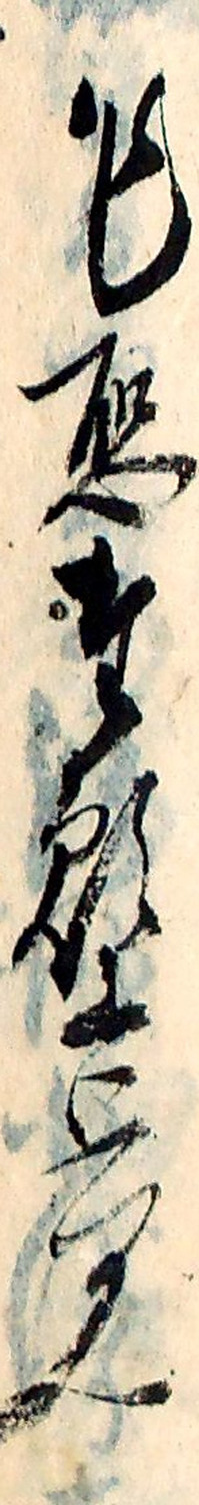乍恐奉願上覚
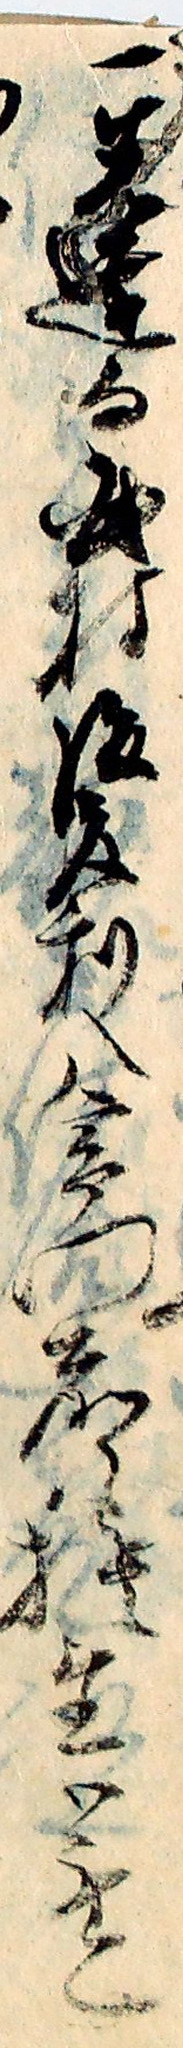一先達て当村後藤利八郎門前に捨置御座候
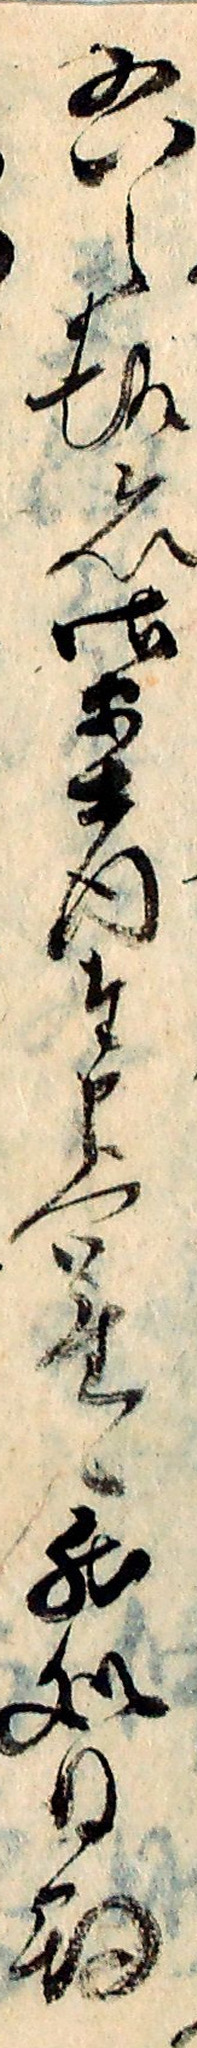右之趣を以御案内奉申上御座候然処同郡
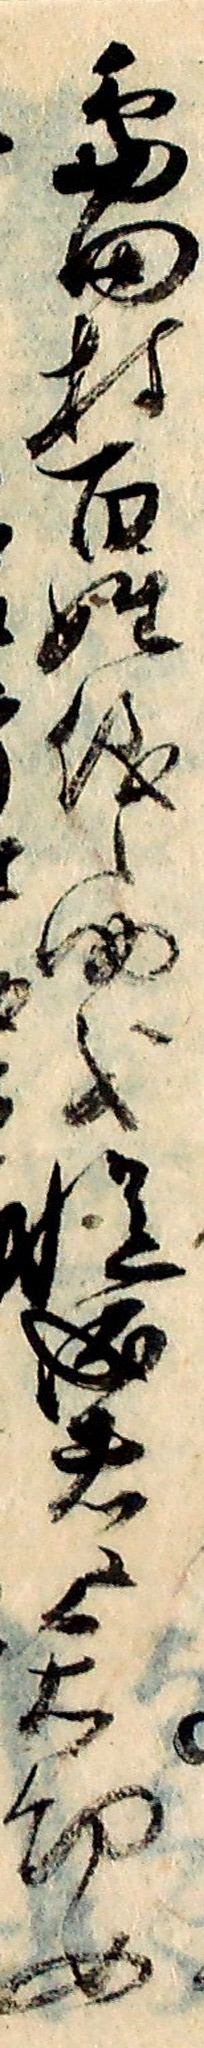島田村百姓儀之助義慥成者にて右幼女
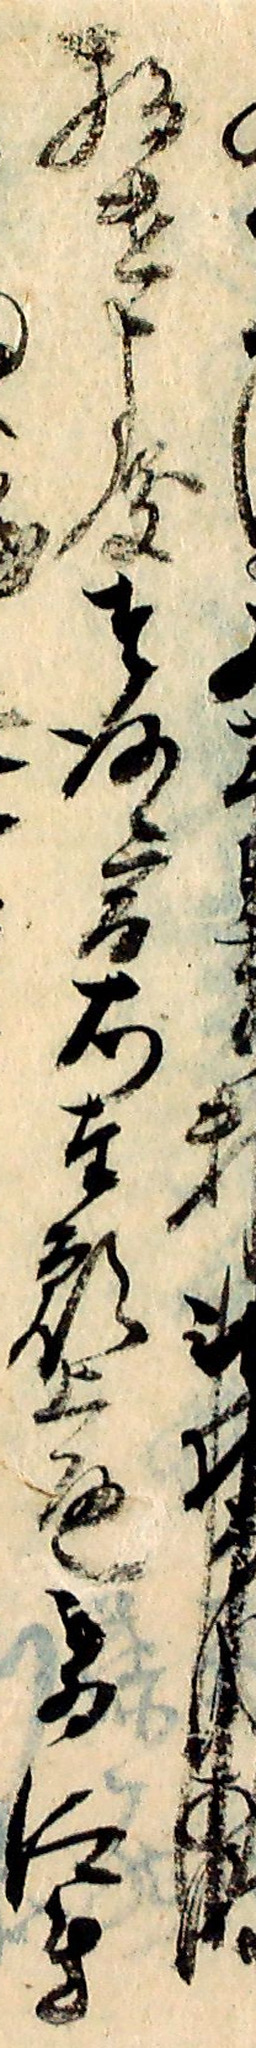指遣申度奉存候間右奉願上通可被仰付
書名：諸御願書控(後藤氏壱番）
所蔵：鳴門教育大学 Naruto University of Education
